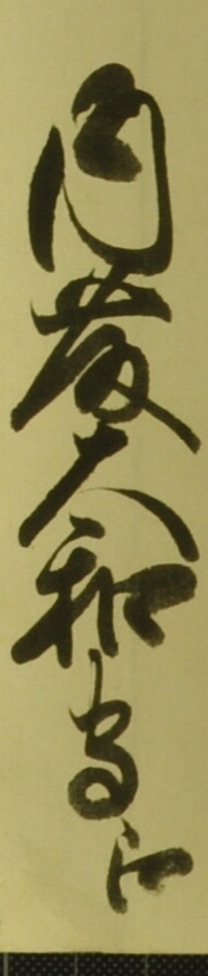内藤大和守え
